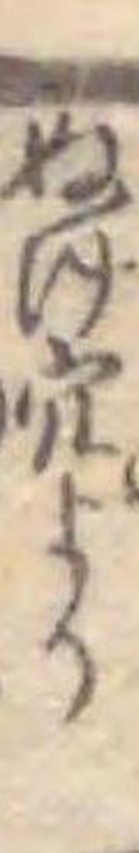ぬけ穴より
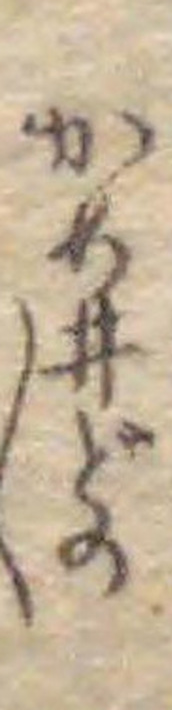かめ井どの
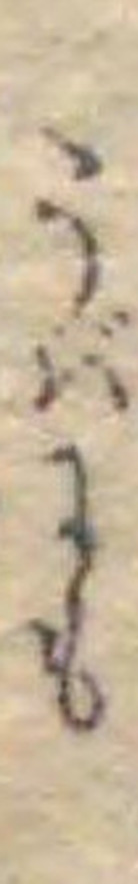うばにも
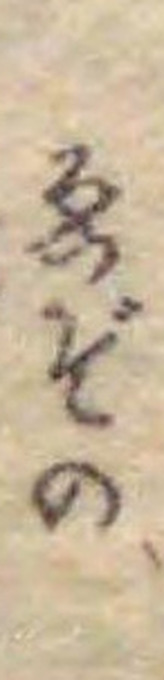ゑぞの
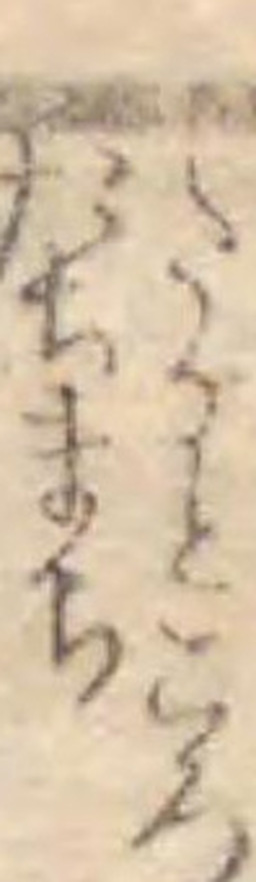たちまち
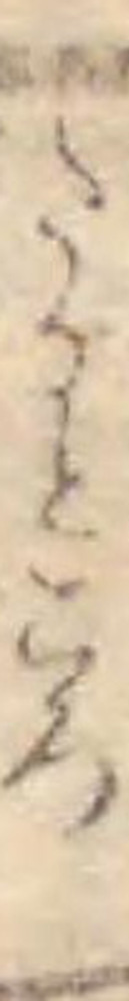たるところ
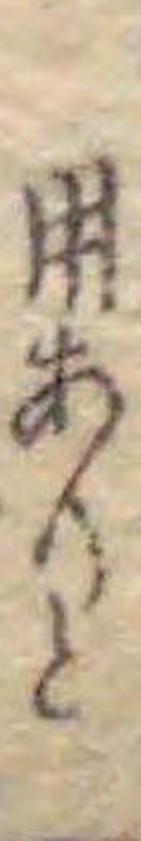用ありと
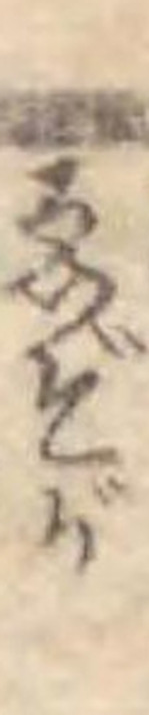ゑぞが
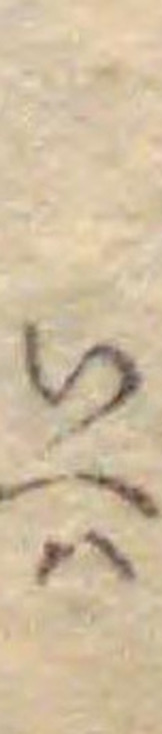いへは
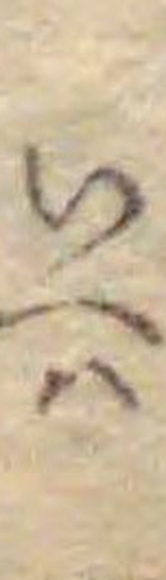いへは
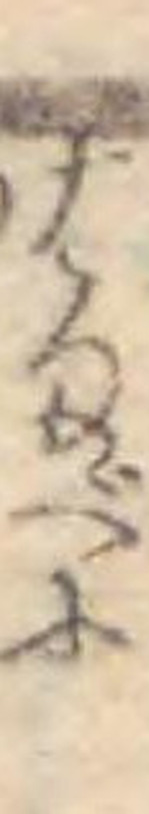はまべに
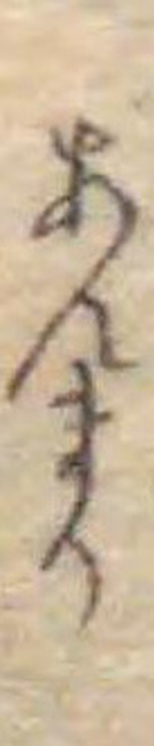あんまり
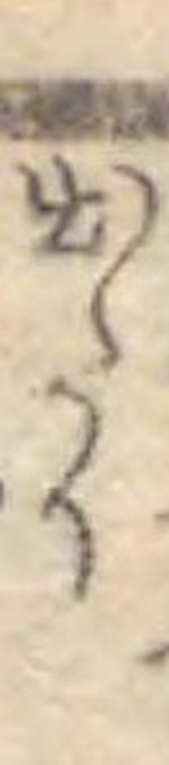出たり
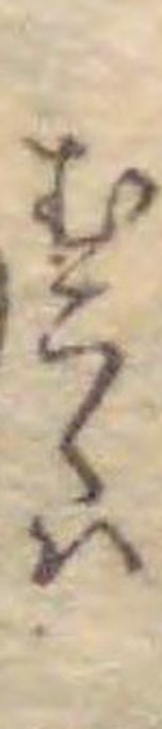むこくは
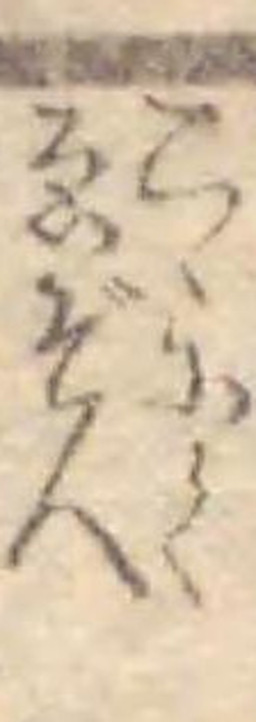ゑぞ人
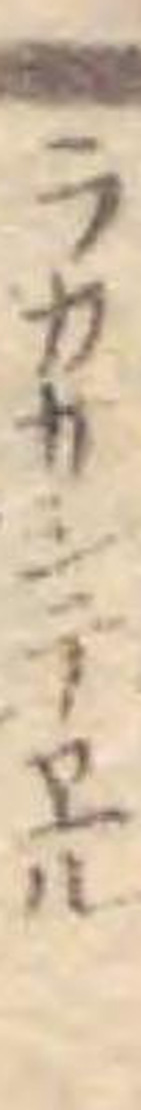ラカサシテヱル
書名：悦贔負蝦夷押領 : 3巻
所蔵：国立国会図書館 National Diet Library, JAPAN
